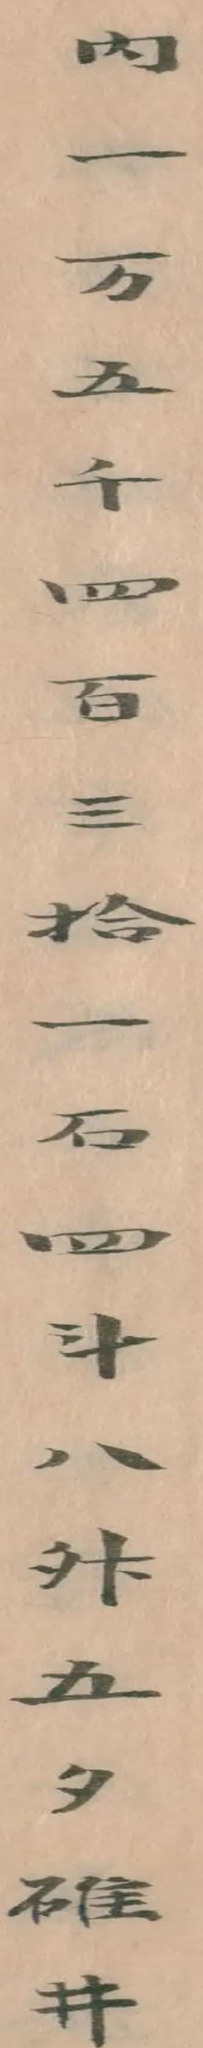内一万五千四百三拾一石四斗八升五夕碓井
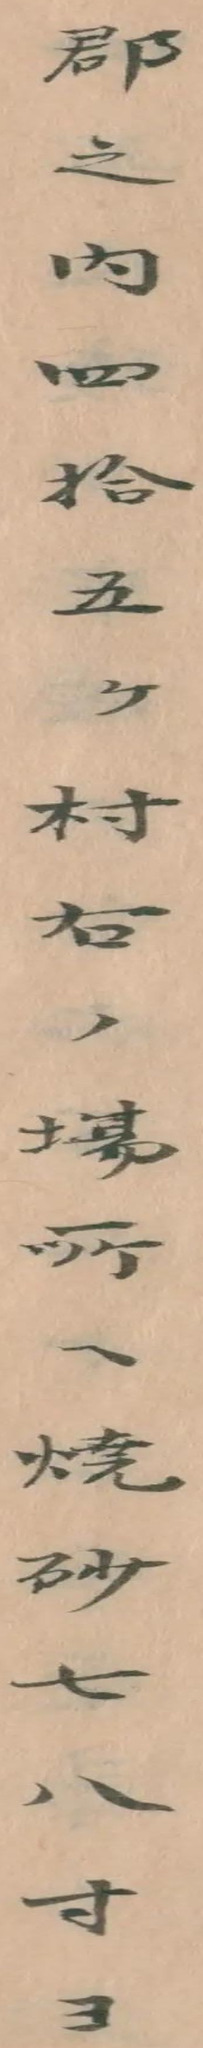郡之内四拾五ヶ村右ノ場所へ焼砂七八寸ヨ

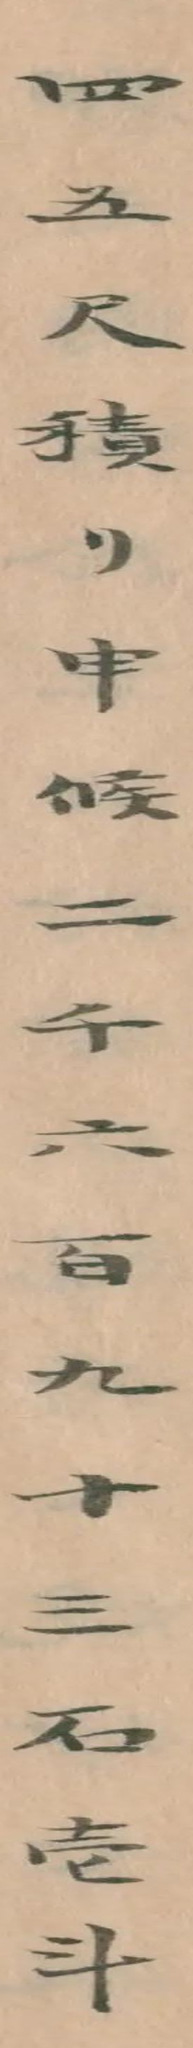四五尺積り申候二千六百九十三石壱斗
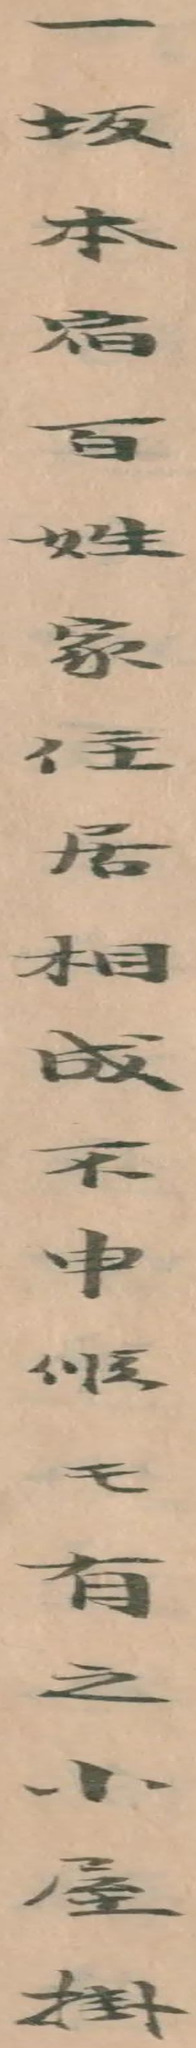一坂本宿百姓家住居相成不申候モ有之小屋掛
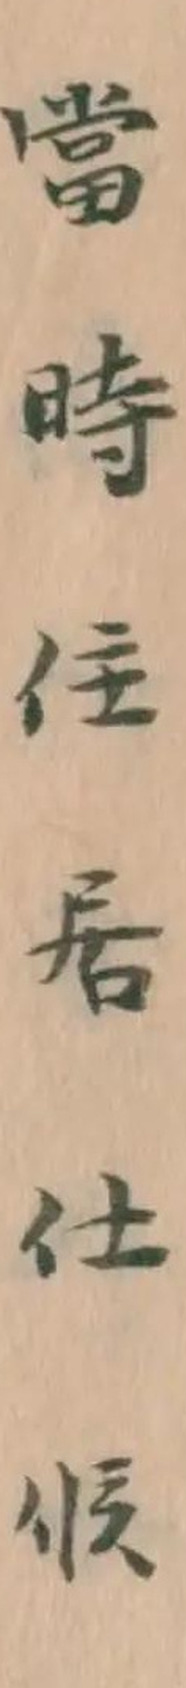当時住居仕候
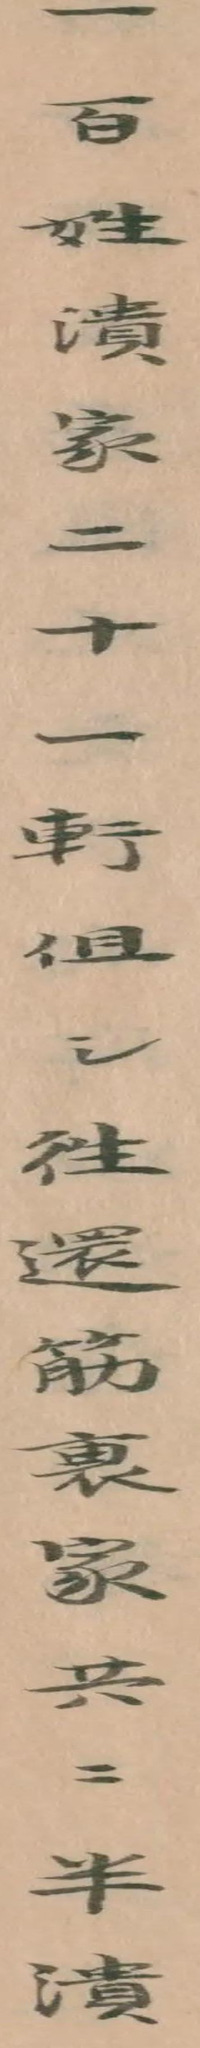一百姓潰家二十一軒但シ往還筋裏家共二半潰
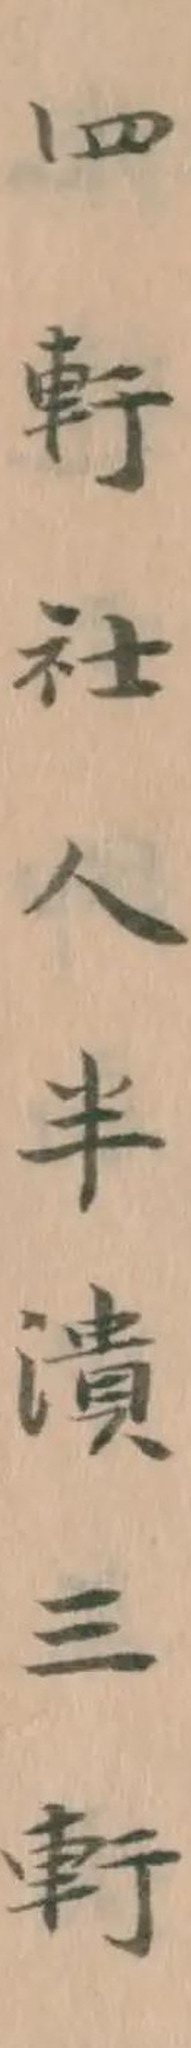四軒社人半潰三軒
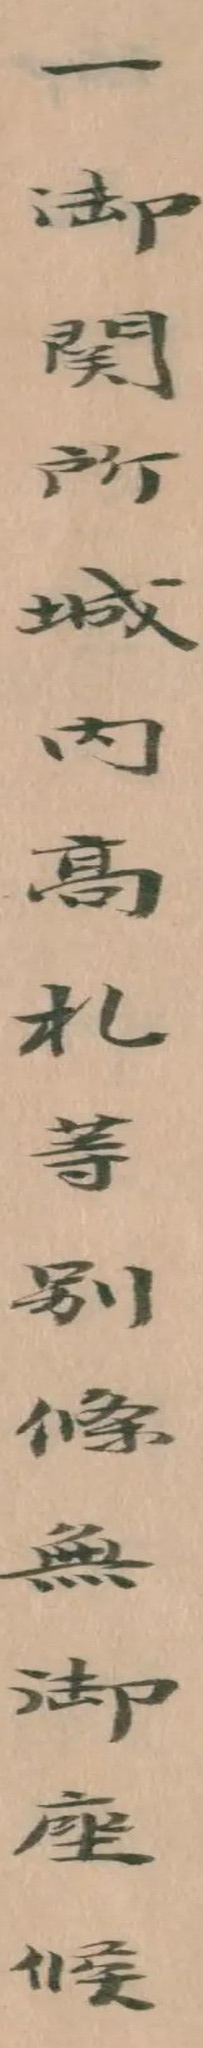一御関所城内高札等別条無御座候
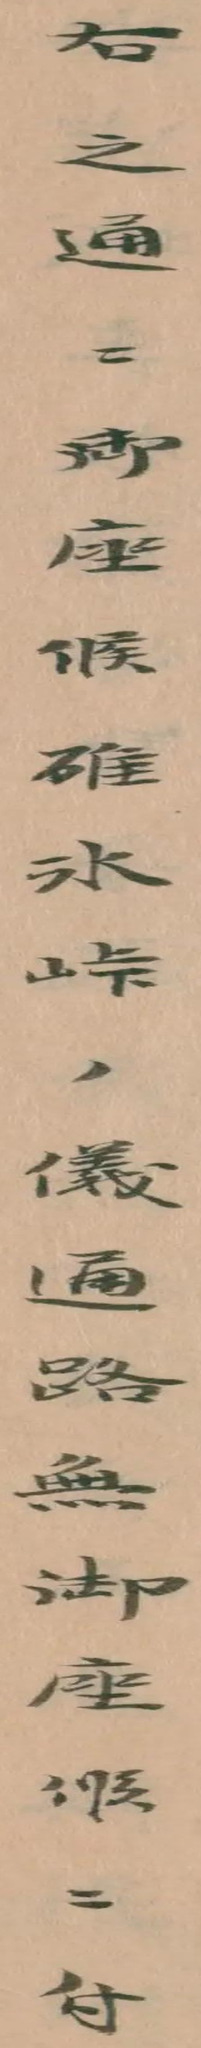右之通二御座候碓氷峠ノ儀通路無御座候二付
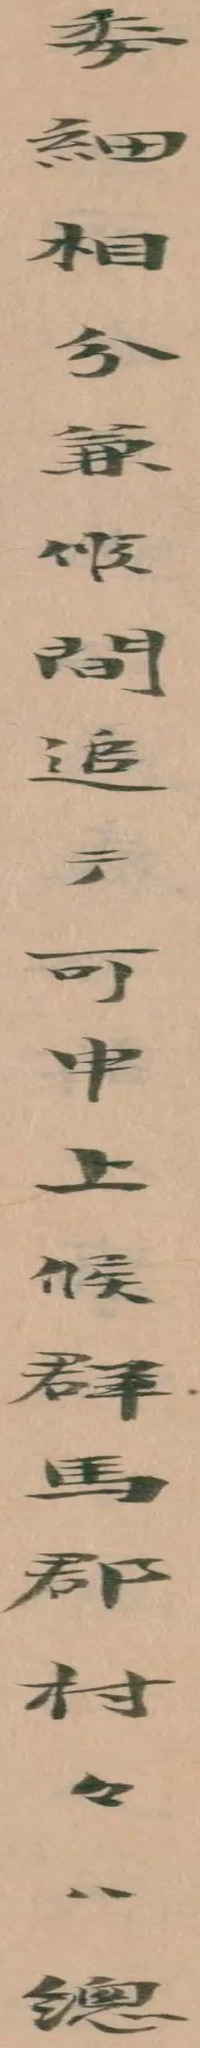委細相分兼候間追々可申上候群馬郡村々ハ総
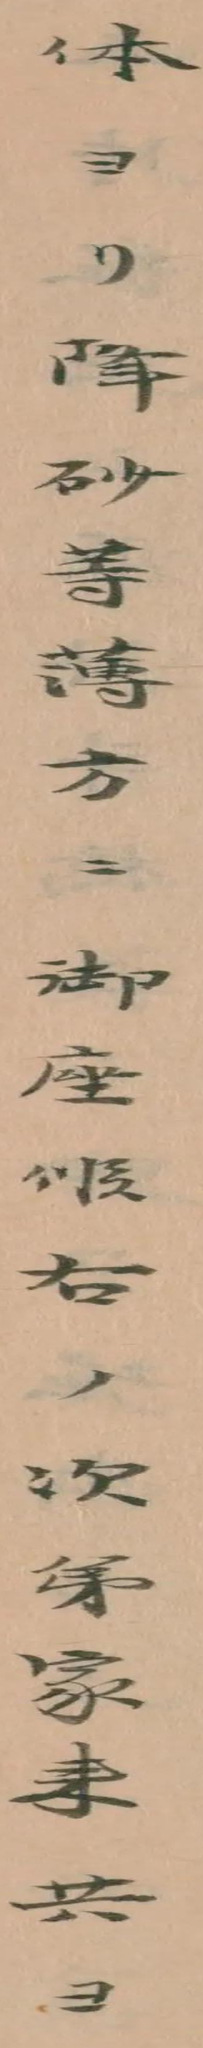体ヨリ降砂等薄方二御座候右ノ次第家来共ヨ
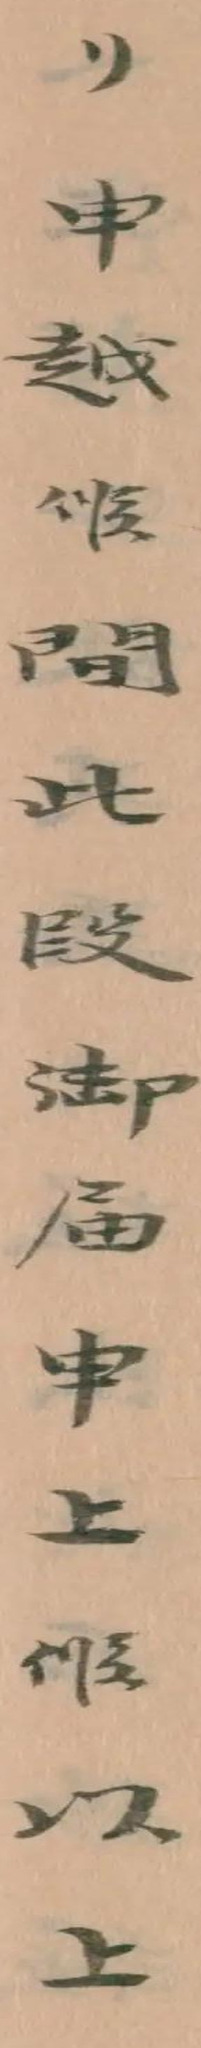リ申越候間此段御届申上候以上
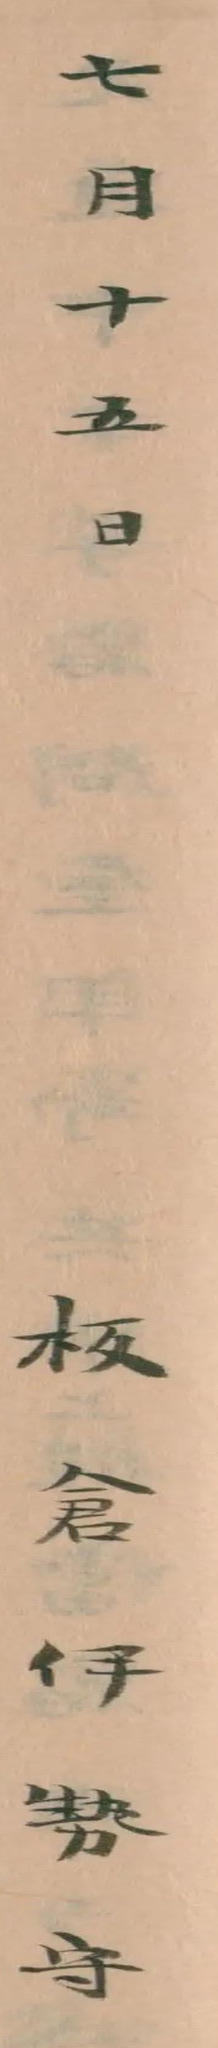七月十五日板倉伊勢守
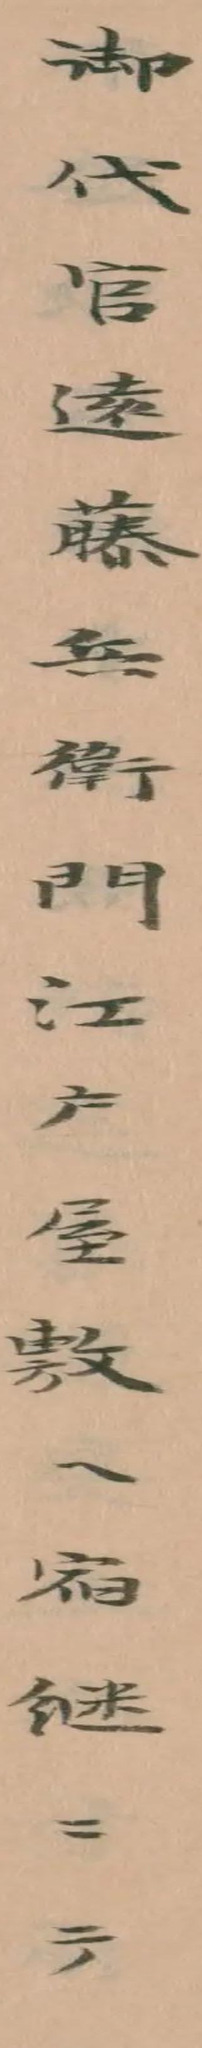御代官遠藤兵衛門江戸屋敷へ宿継ニテ
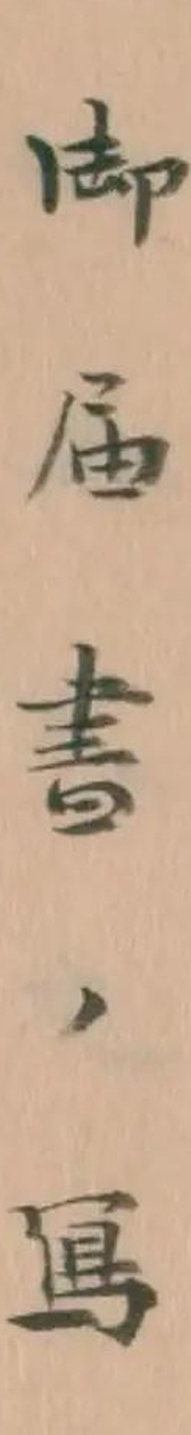御届書ノ写
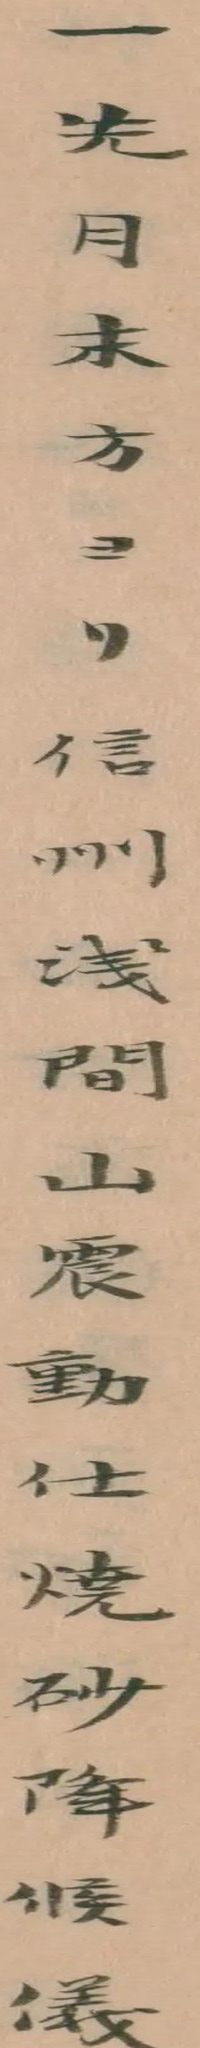一先月未方ヨリ信州浅間山震動仕焼砂降候儀
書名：地災撮要. 巻3(地震之部)-巻4(噴火之部)
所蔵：国立国会図書館 National Diet Library, JAPAN
